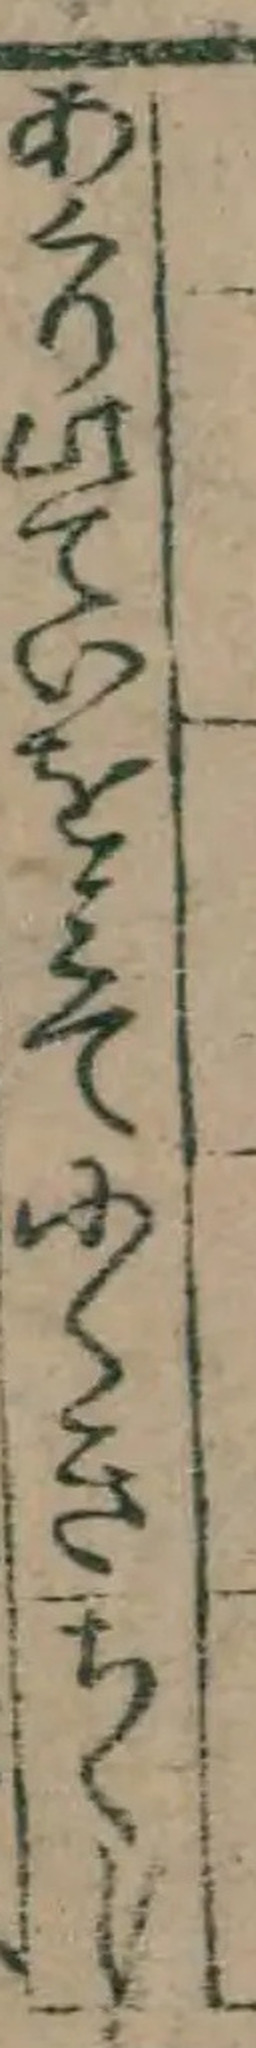あくり此ていをみてにくきちくし
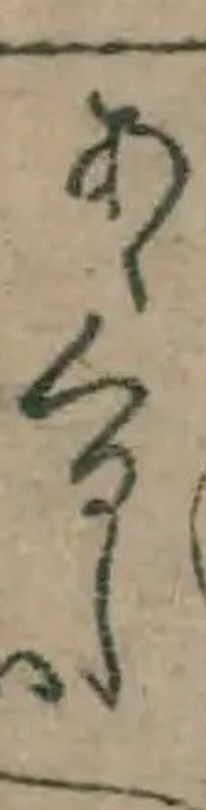あゝくるしい
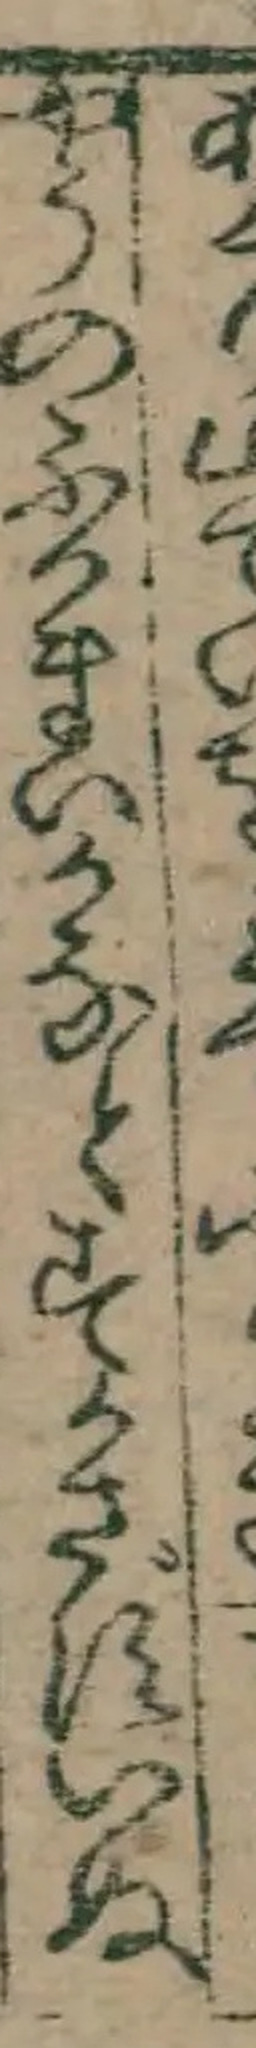やうのふるまいかなとすかさずいぬ
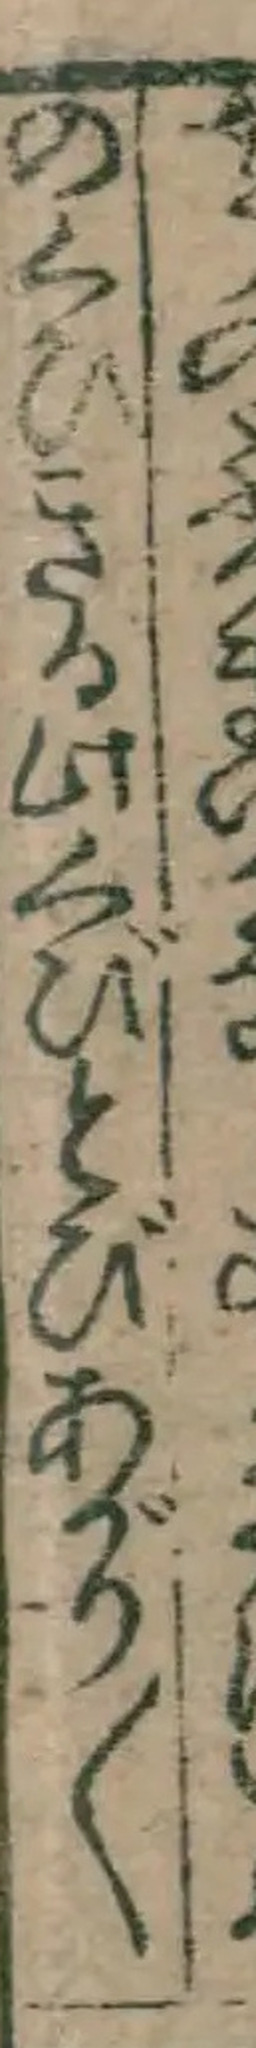のくひきる此くびとびあがり〳〵
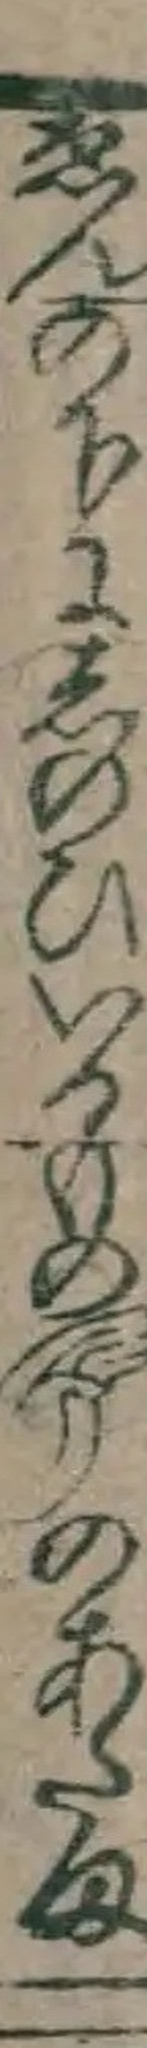ゑんの下にしのひいるもののあたま
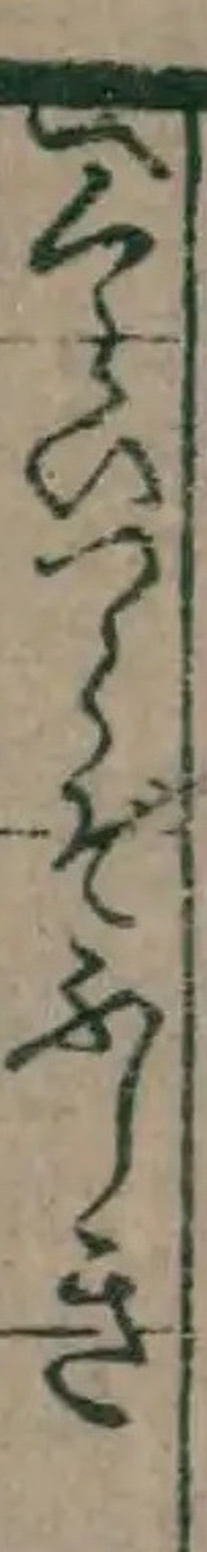へくらいつくぞふしき
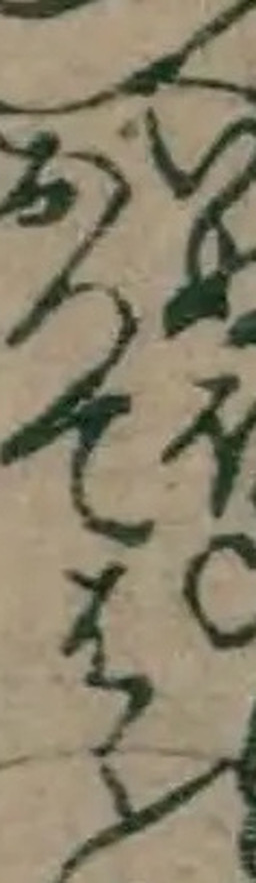おつてはゝ
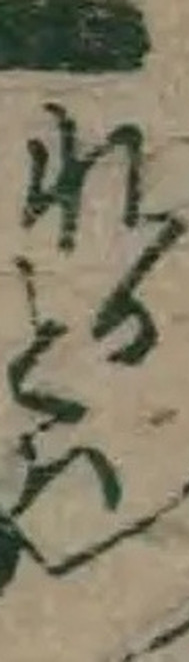れるとは此
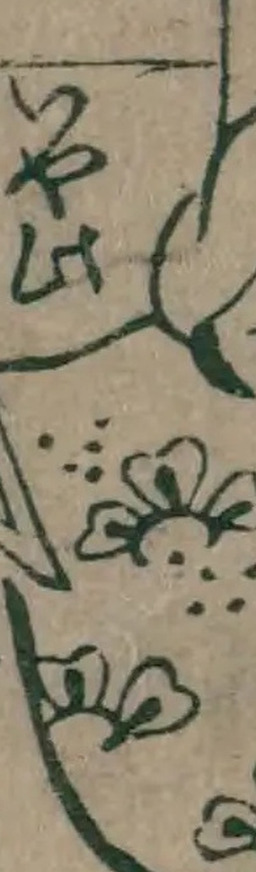いや此
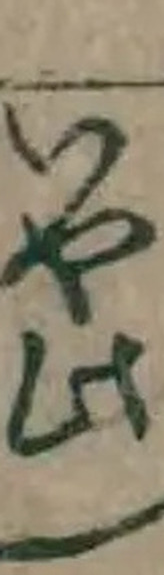いや此
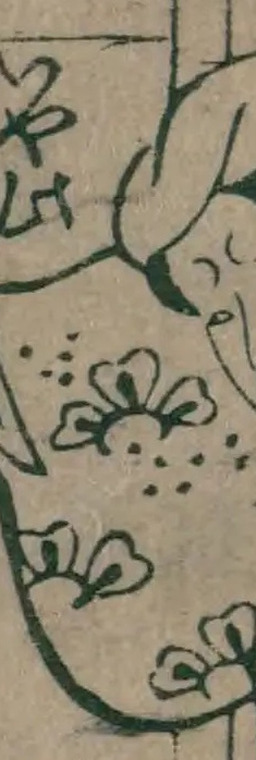いや此
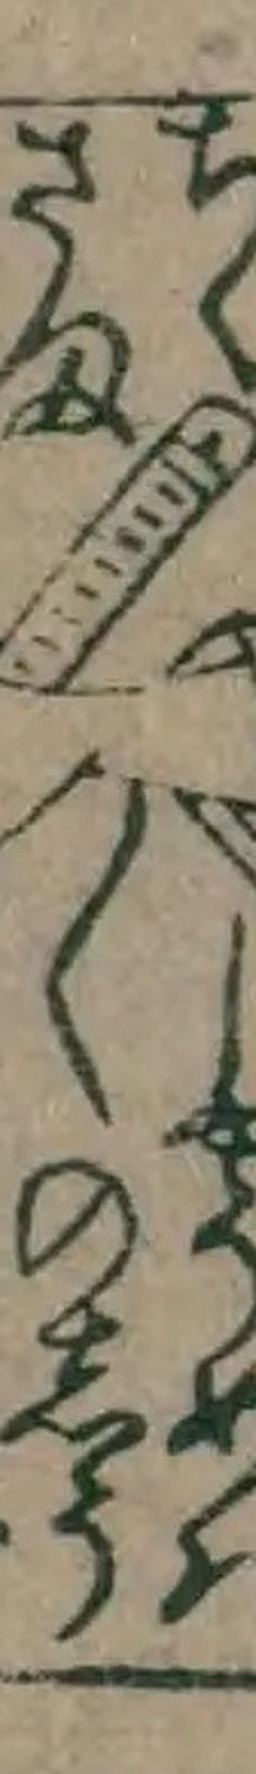さま〳〵のしう
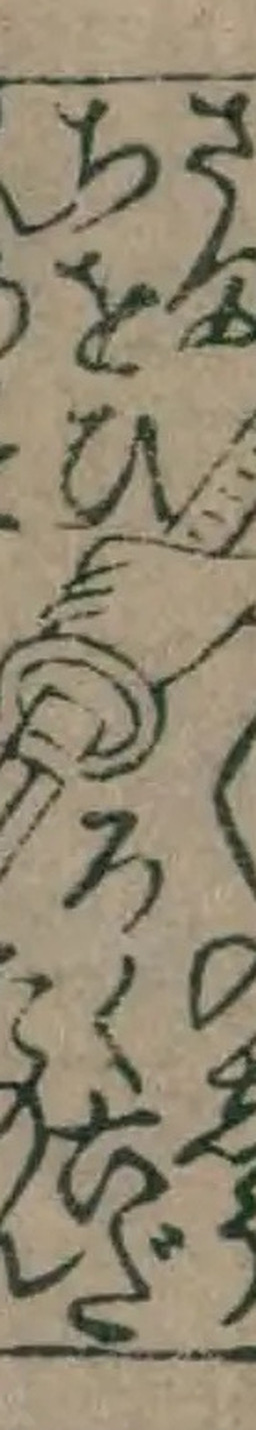ちをひろく六だ
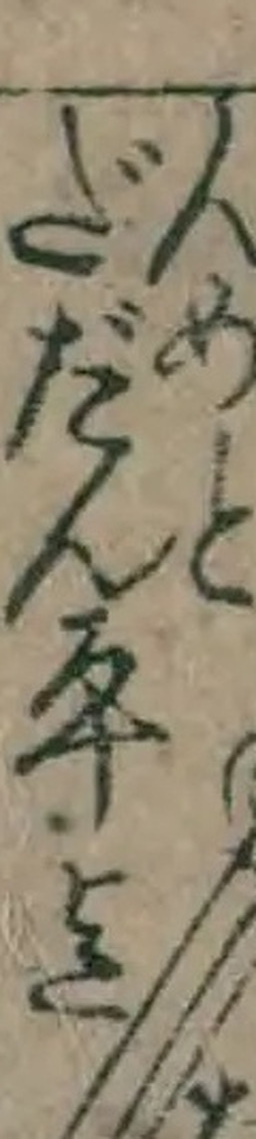だだん平迄
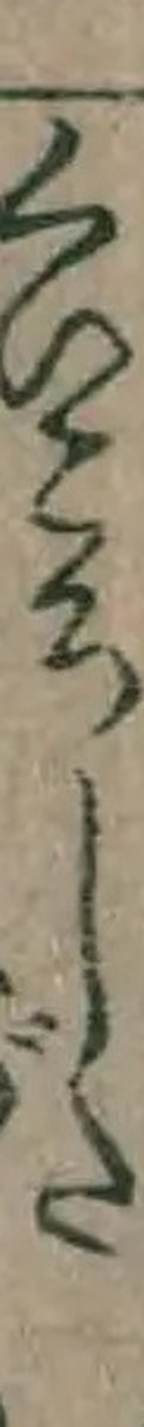くいころした
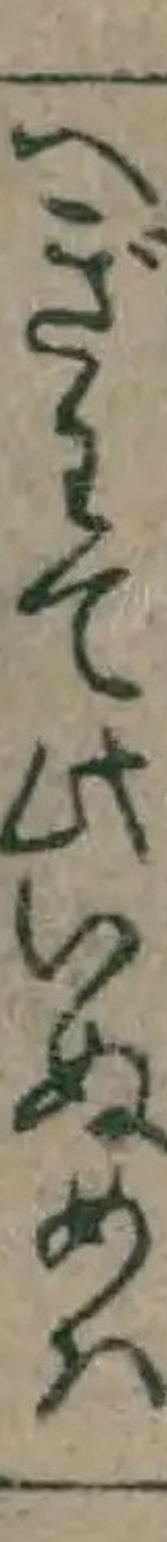へぎわて此いぬめは
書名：団十郎蓬芥伝
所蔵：国立国会図書館 National Diet Library, JAPAN
